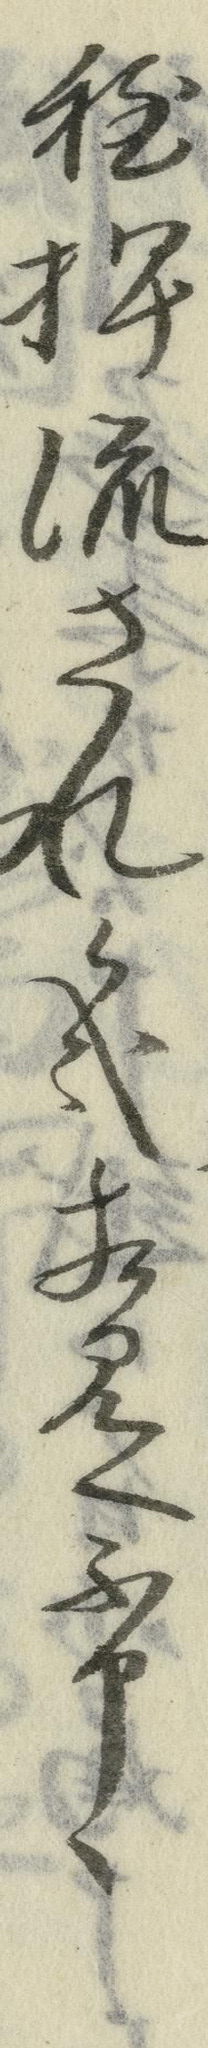程押流され候哉相見ヘ不申候
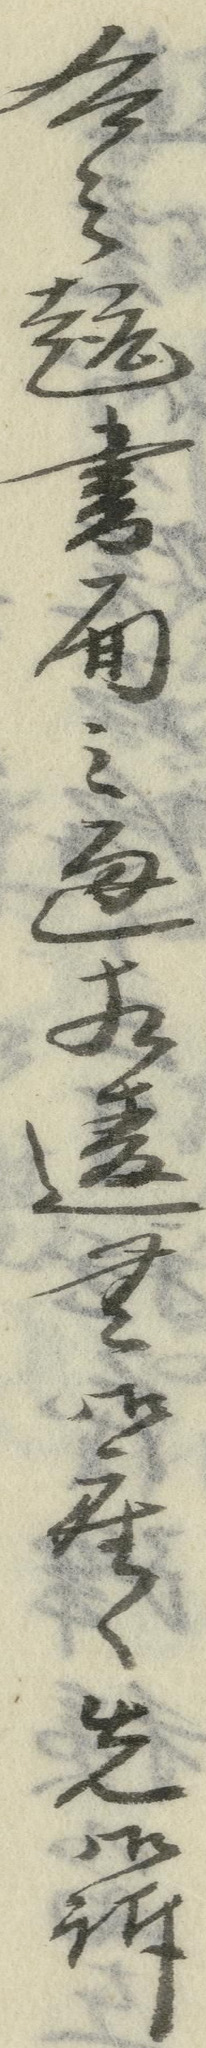右之趣書面之通相違無御座候先御訴
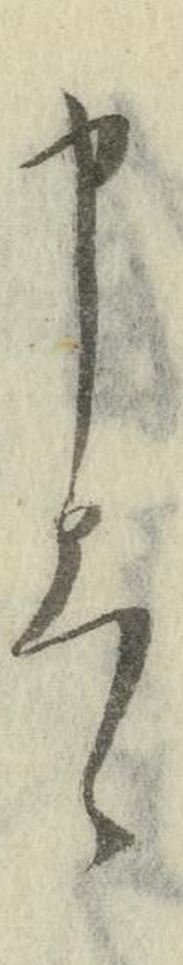申上候
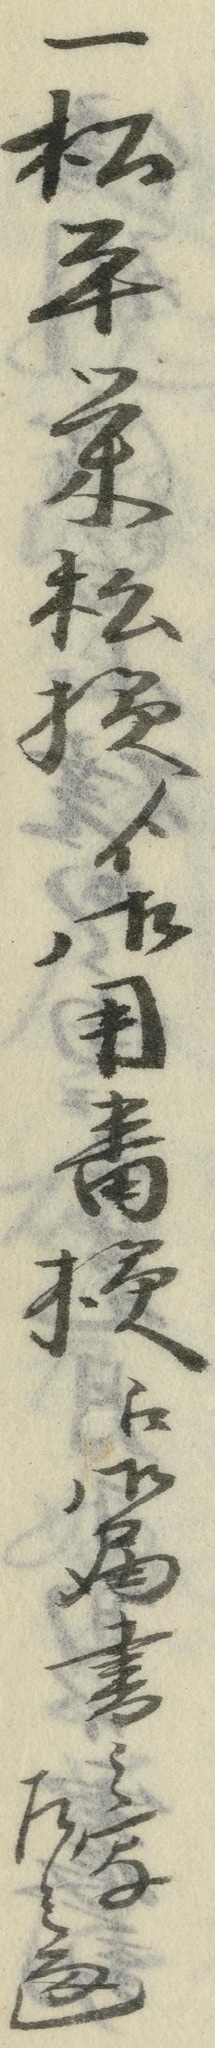一松平栄松様ゟ御用番様江御届書之写

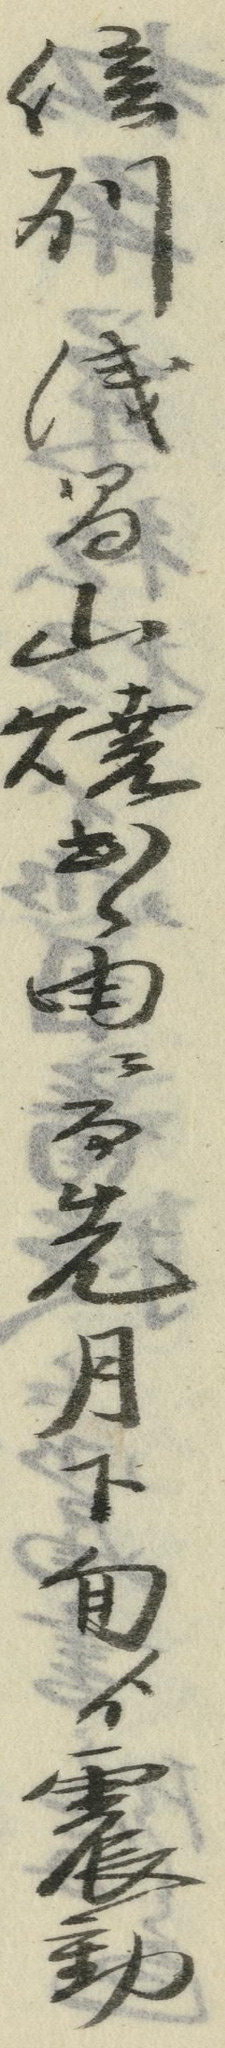信州浅間山焼出候由ニ而先月下旬ゟ震動
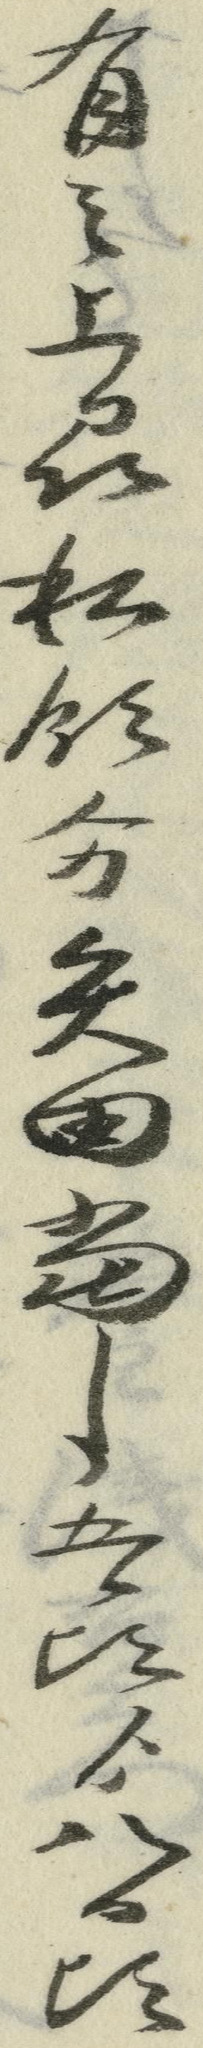有之上州私領分矢田当月五日頃ゟ八日頃
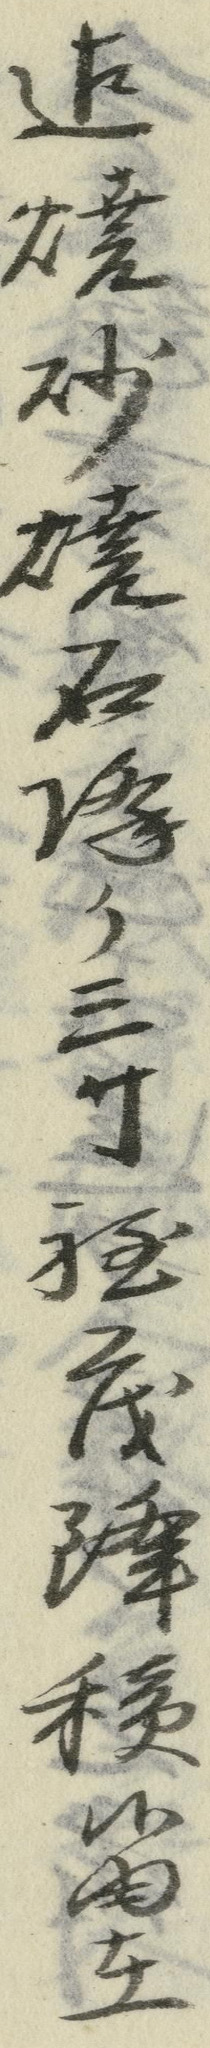迄焼砂焼石降リ三寸程茂降積候由在
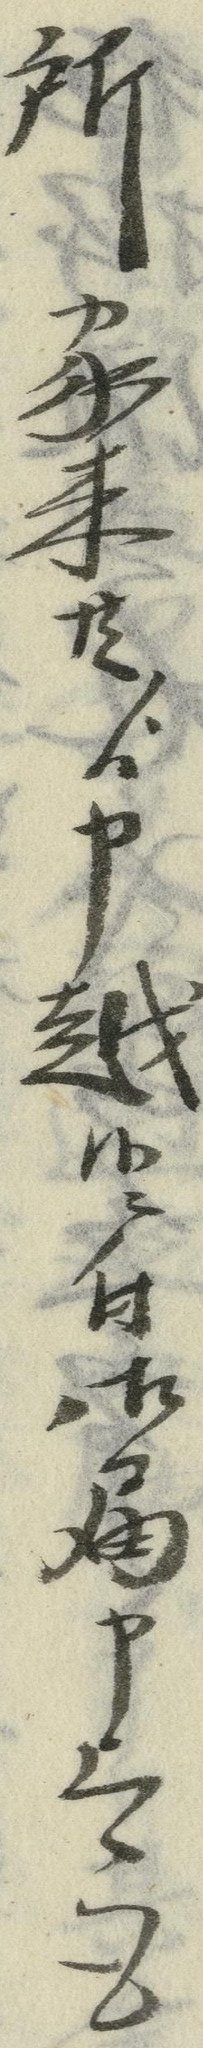所家来共ゟ申越候ニ付御届申上候以上
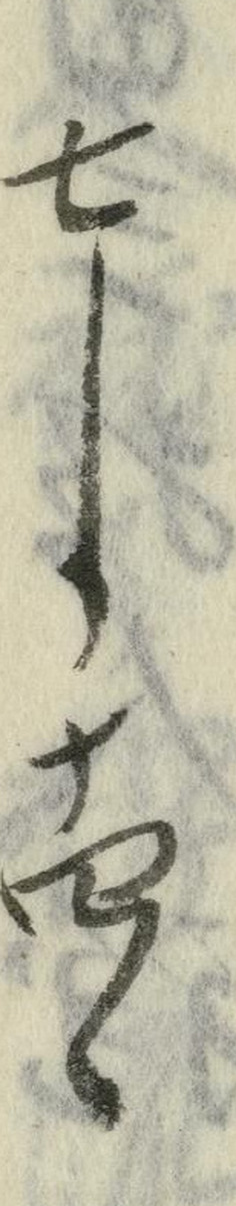七月十四日
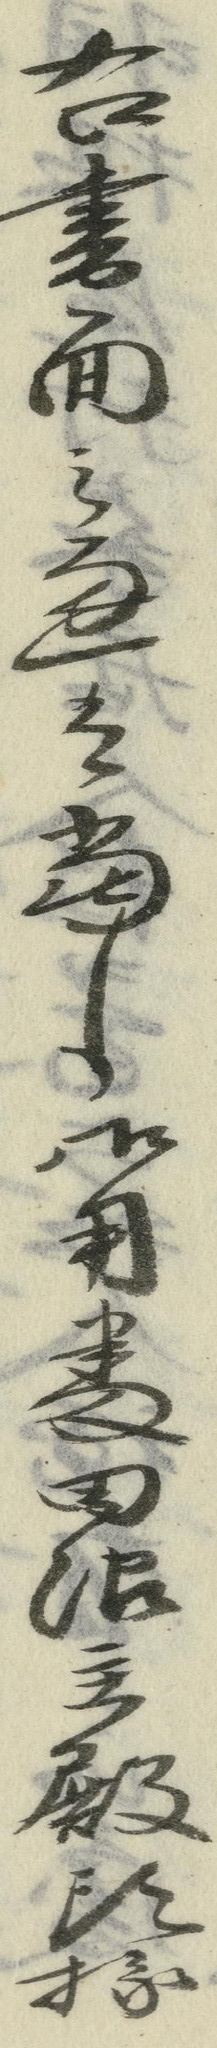右書面之通は当月御用番田沼主殿頭様
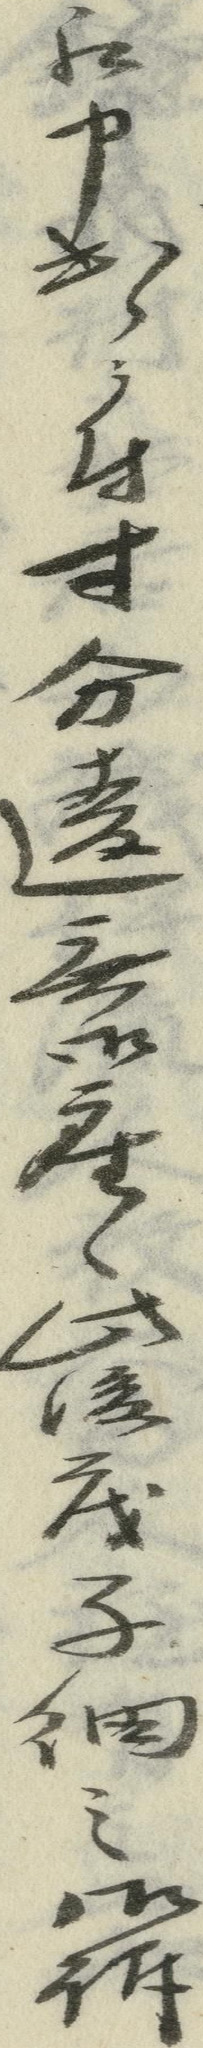江申出候ニ付寸分違無御座候此後茂子細之御訴
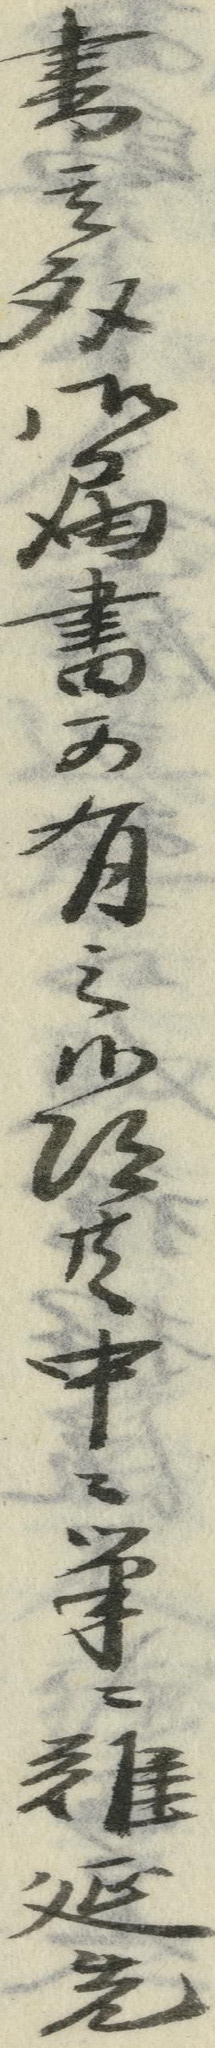書其外御届書可有之候得共中々筆ニ難延先
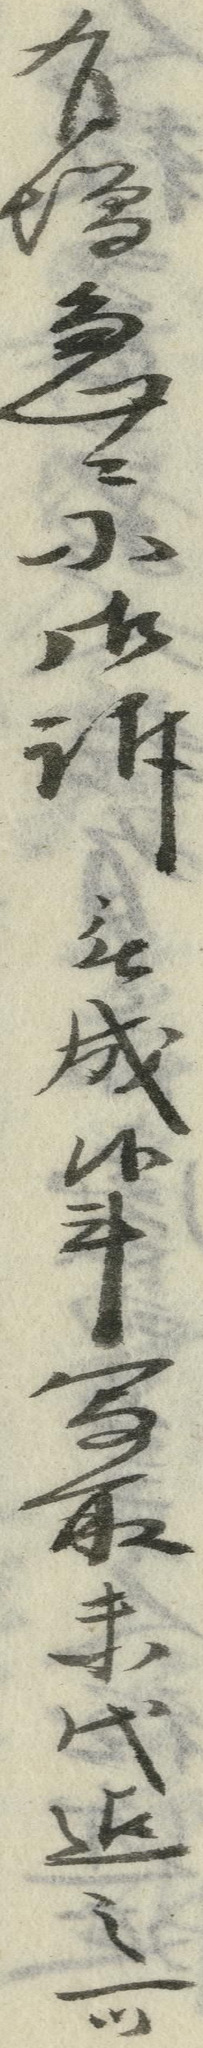有増急ニに御訴被成候斗写取末代迄之可
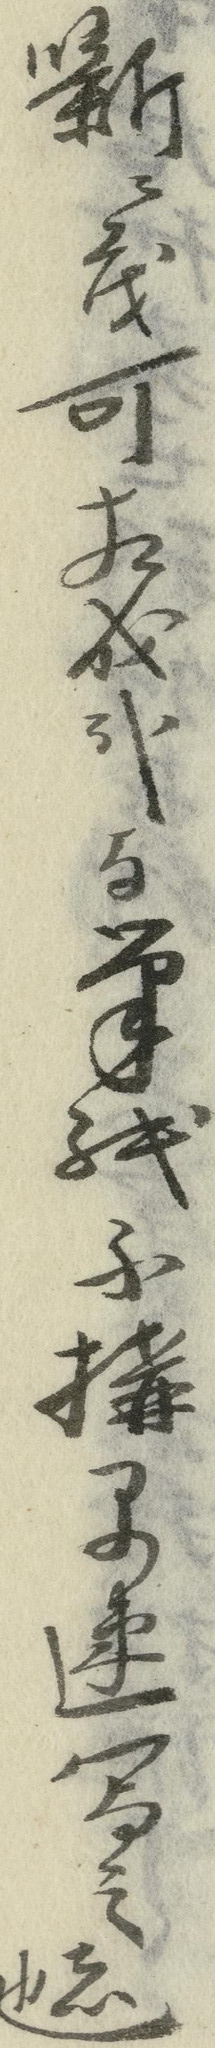噺ニ茂可相成哉と筆紙不構早速写之者也
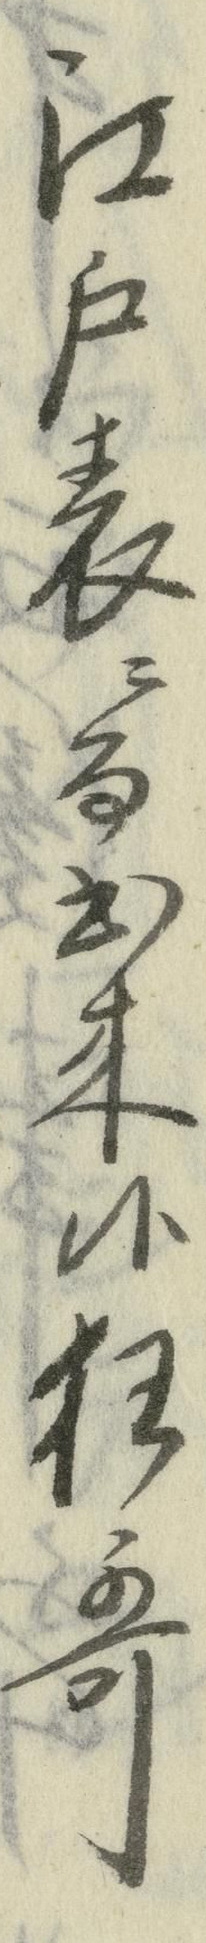江戸表ニ而出来候狂歌
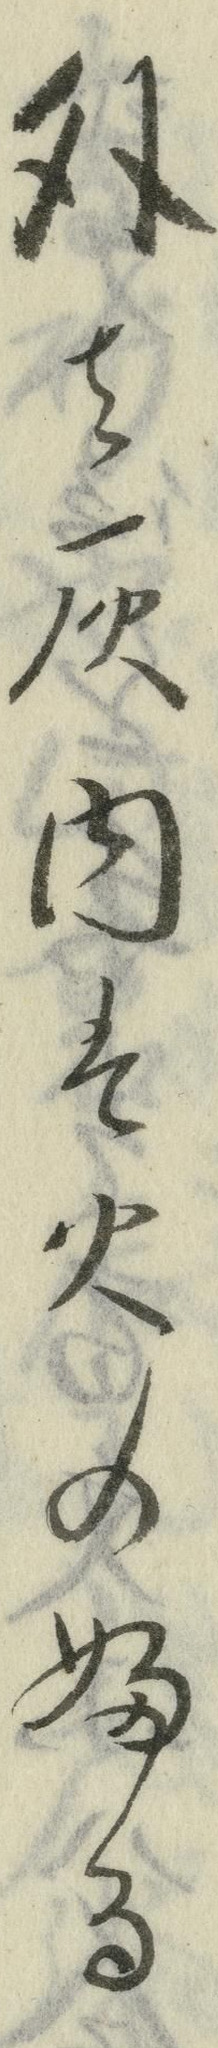外は灰内は火のふる
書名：天明三癸卯七月信州浅間山焼出シ上州山津浪ニ付近國ヨリ御届書并訴書写
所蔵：東京大学地震研究所図書室 Earthquake Research Institute Library, The University of Tokyo, JAPAN
